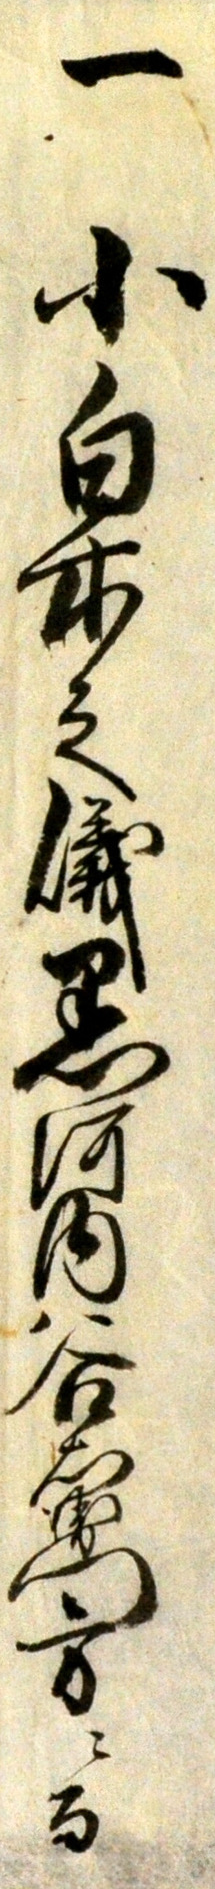一小白木之儀黒河内谷右衛門方ニ而
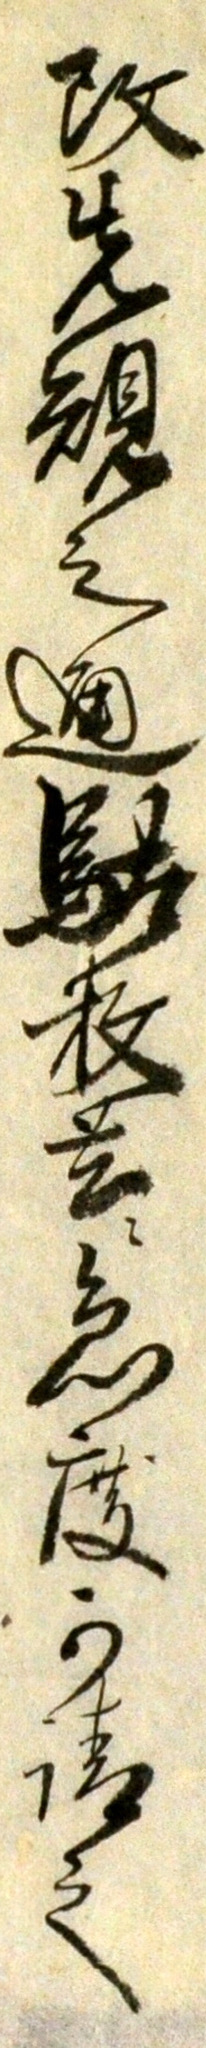改先規之通駄枚共ニ急度可請之
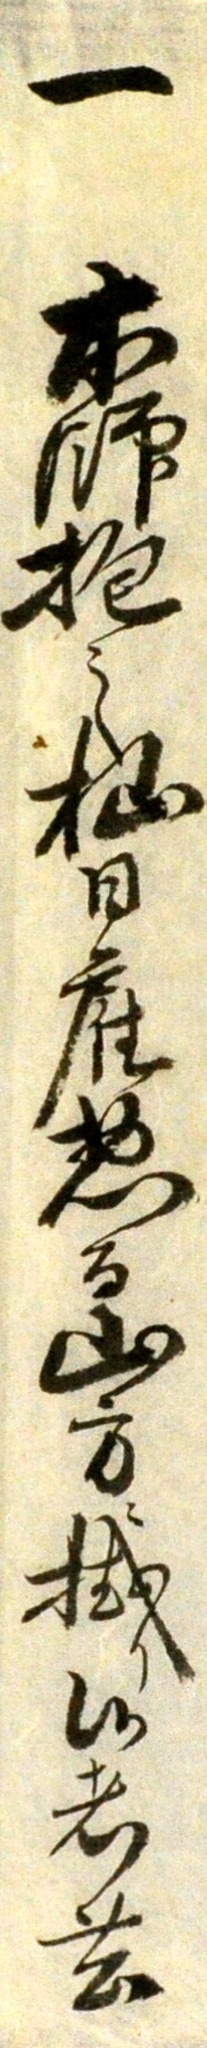一木師抱之杣日雇惣而山方ニ掛り候者共
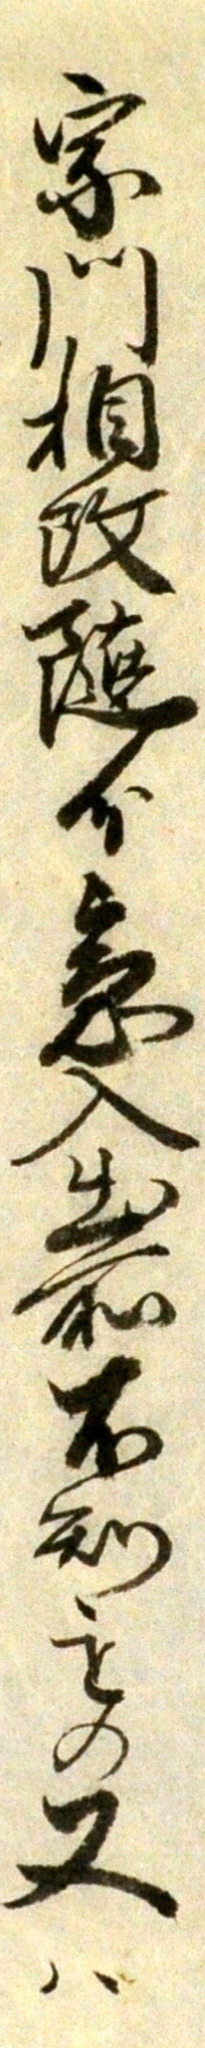宗門相改随分念入出所不知もの又ハ
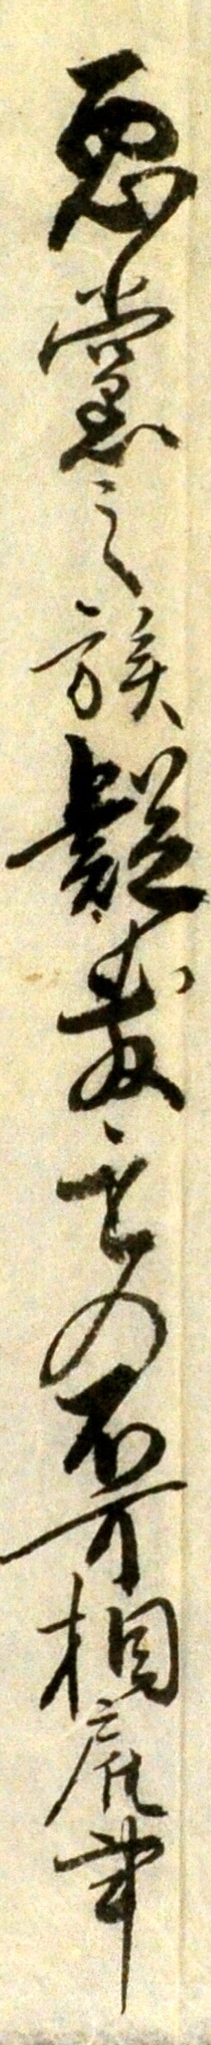悪党之族疑敷もの不可相雇事
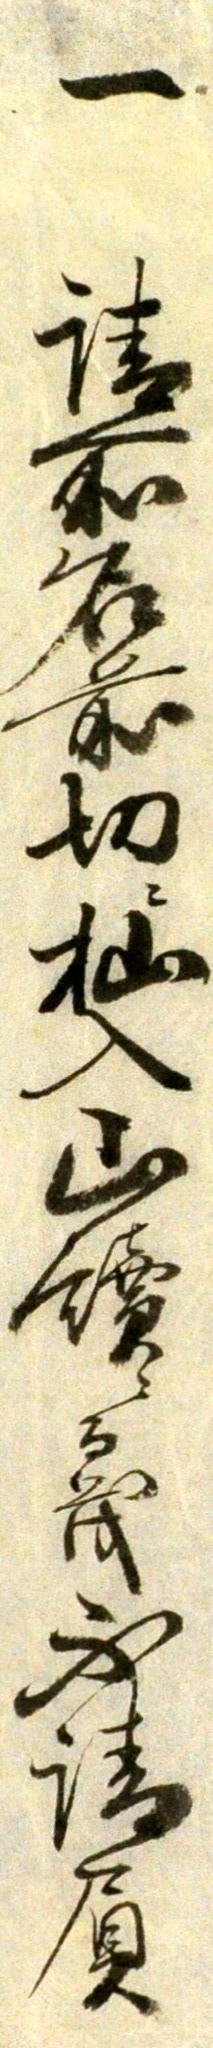一請所名前切ニ杣入山続ニ而茂不請負
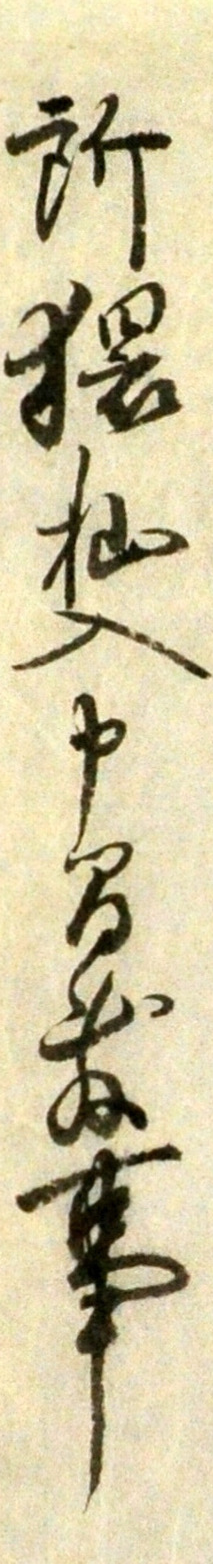所猥杣入申間敷事
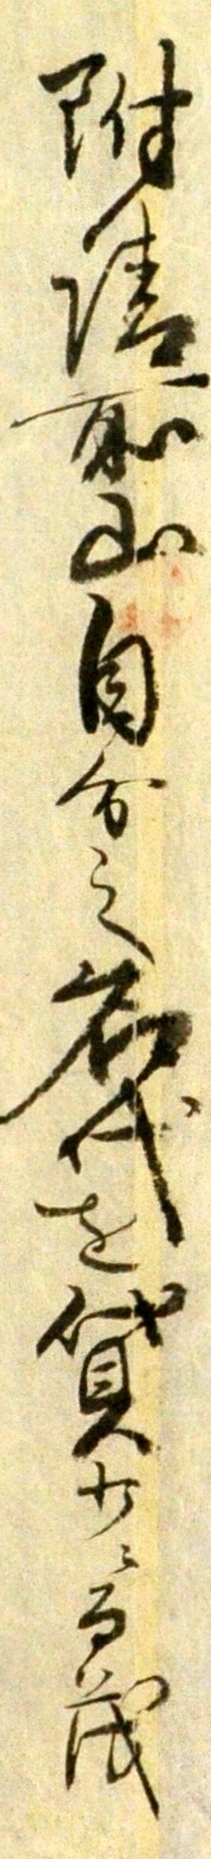附請所山自分之名代を貸少ニ而茂
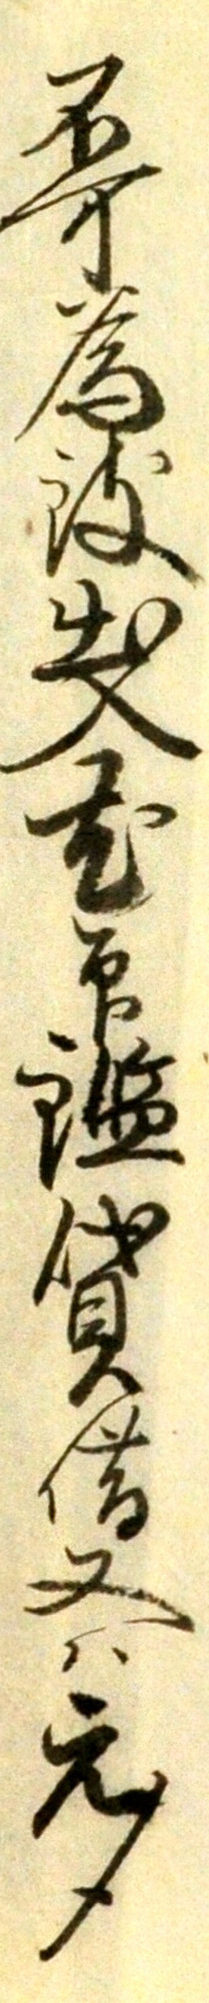不可為致出入尤印鑑貸借又ハ元〆
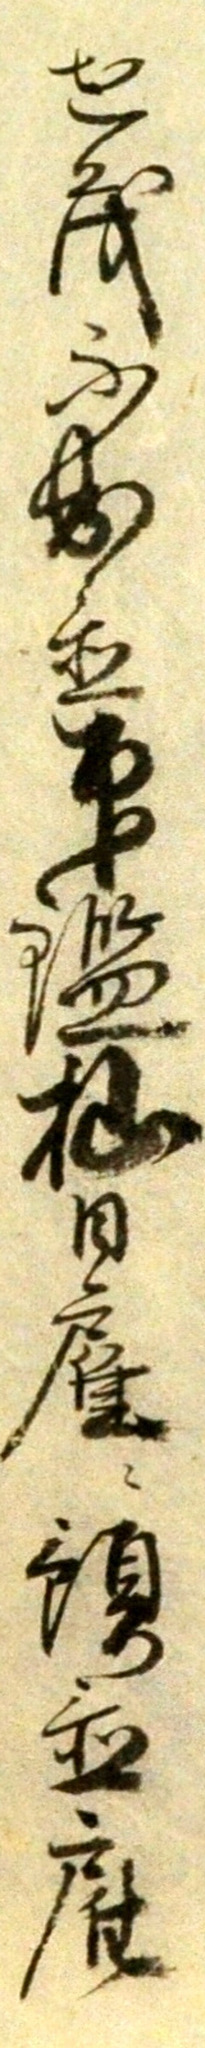を茂不出置印鑑杣日雇ニ預置雇
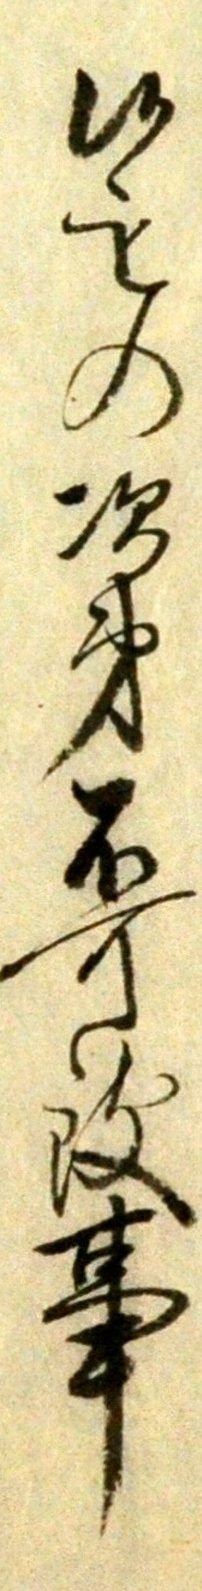候もの次第不可致事

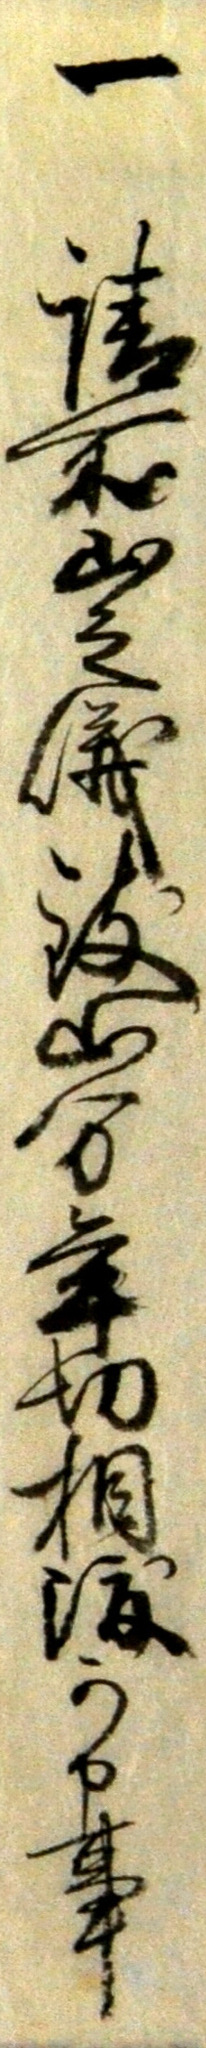一請所山之儀致山分年切相渡可申事
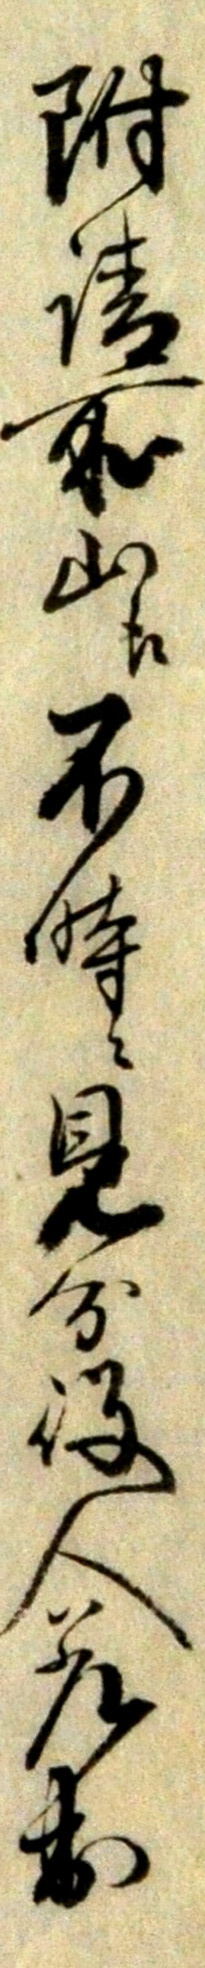附請所山江不時ニ見分役人差出
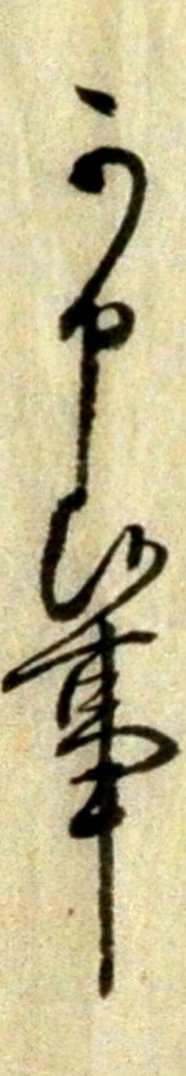可申候事
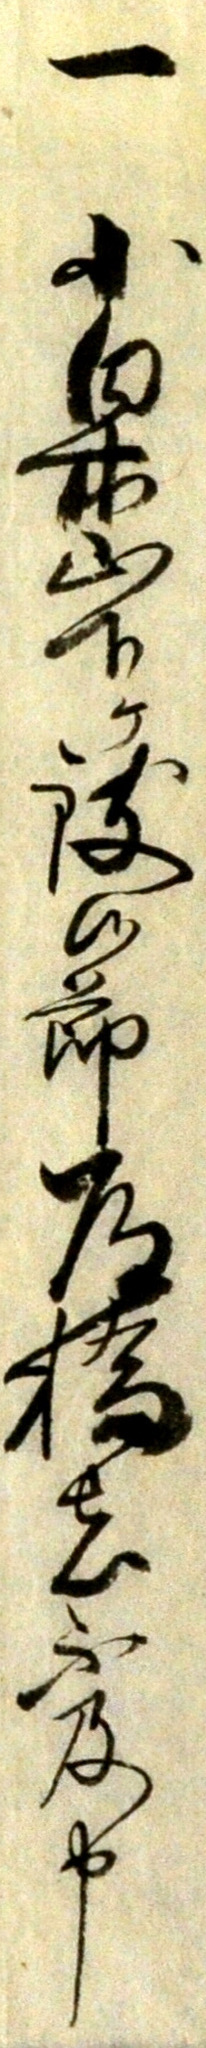一小白木山下ケ致候節為橋者不及申
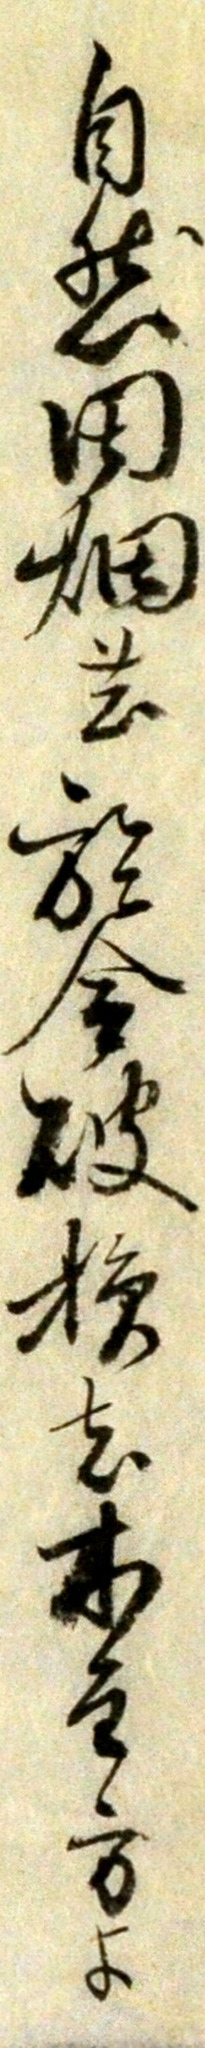自然田畑共於令破損者木主方よ
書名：木師定法（写）
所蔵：伊那市立高遠町図書館・合同会社AMANE
